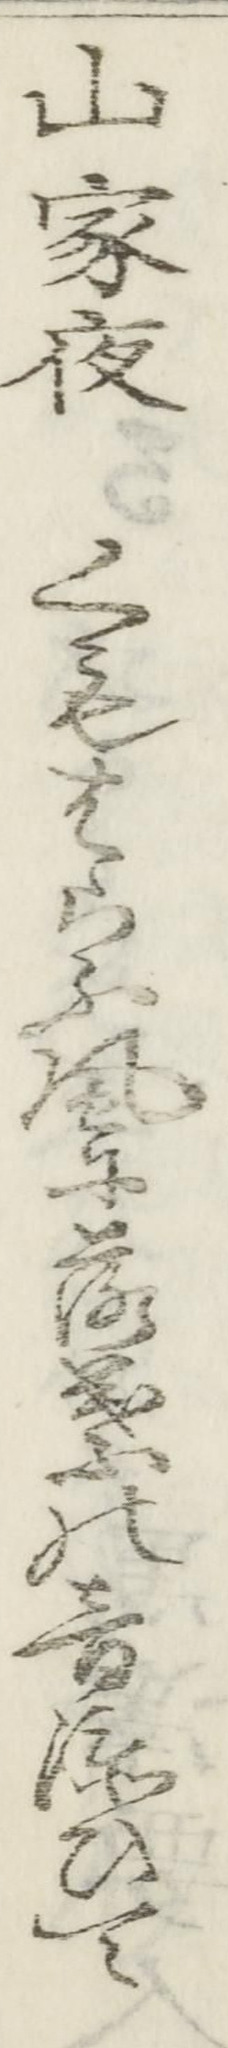山家夜くもはらふ風に落葉の音添ひて
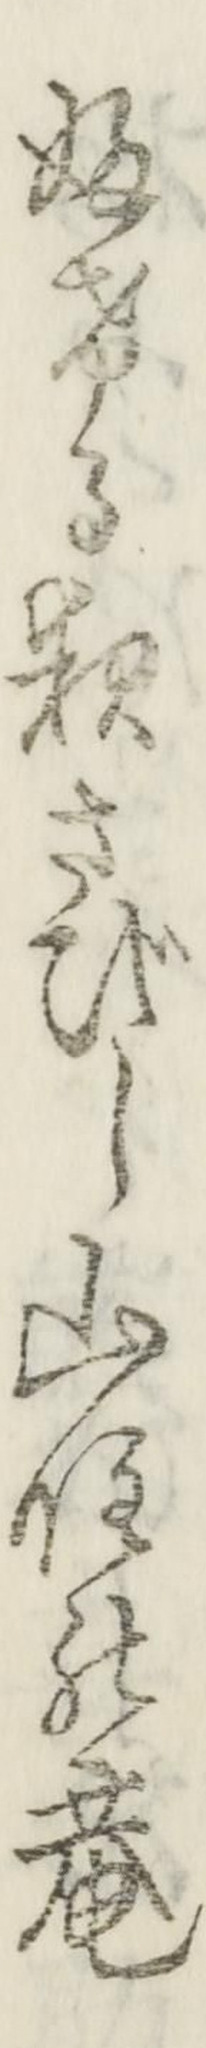ふける夜さびし山住の菴
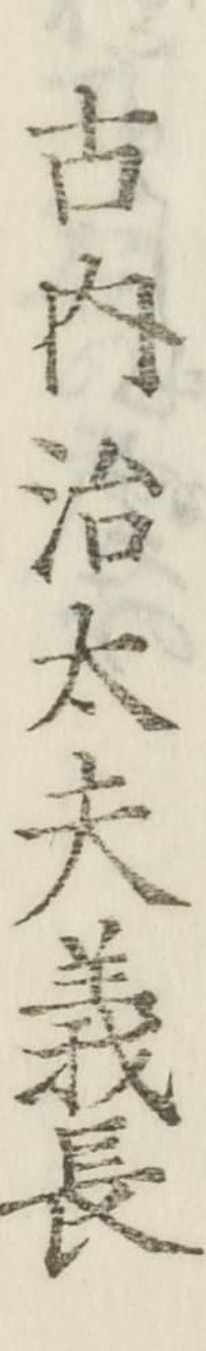は古内治太夫義長
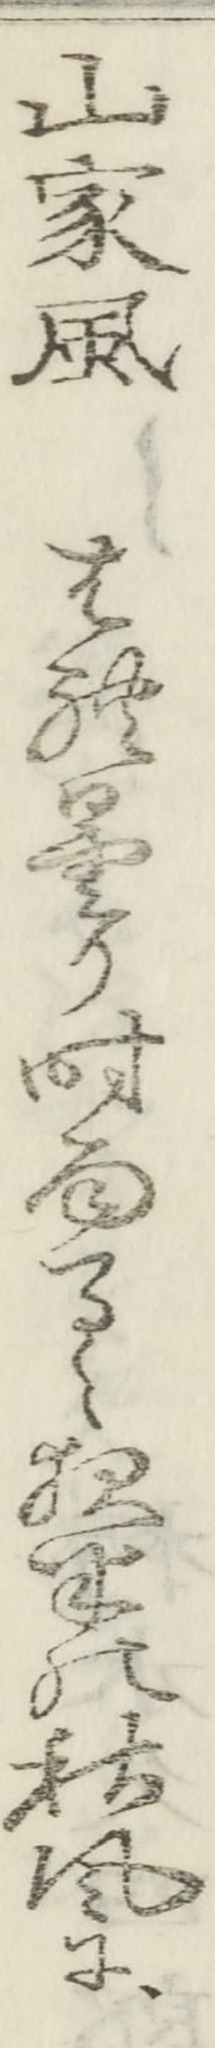山家風はれ曇り時雨るゝ夜半の秋風に
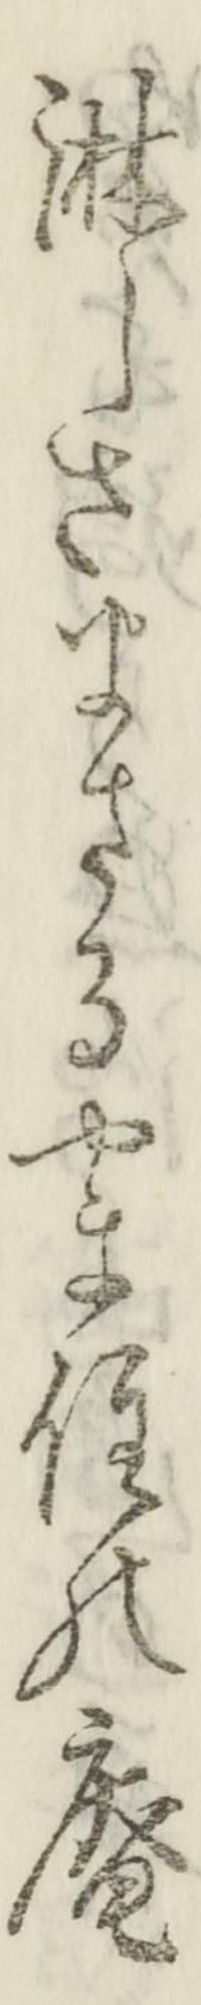淋しさまさるやま住の庵
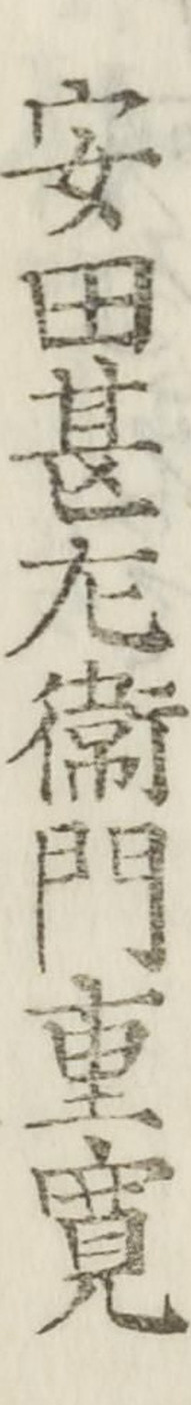う安田甚左衛門東寛
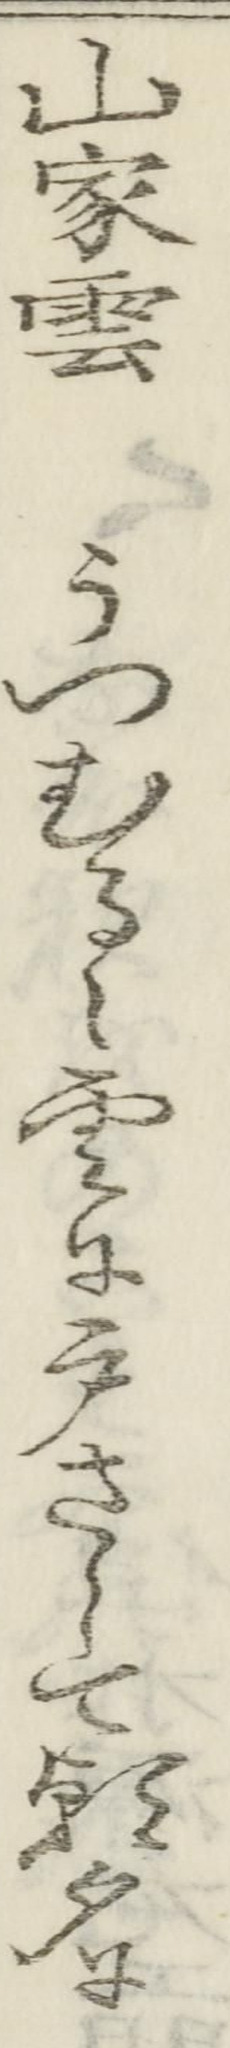山家雲うつむるゝ雲に戸さして朝夕に
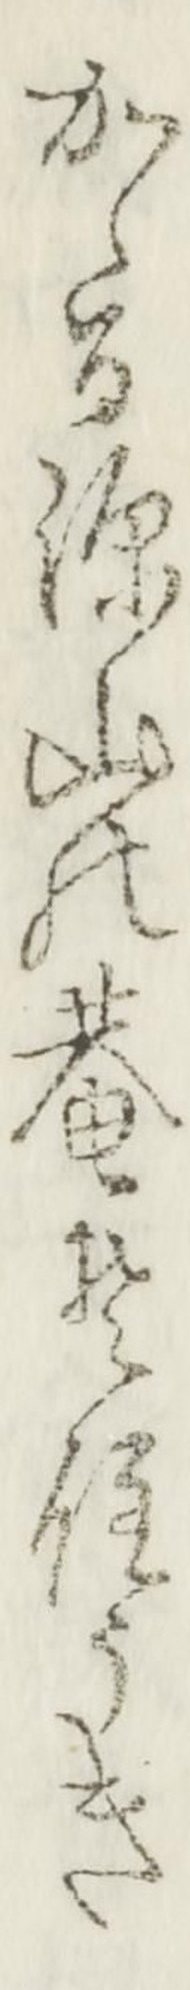かゝる深山の菴そ住うき
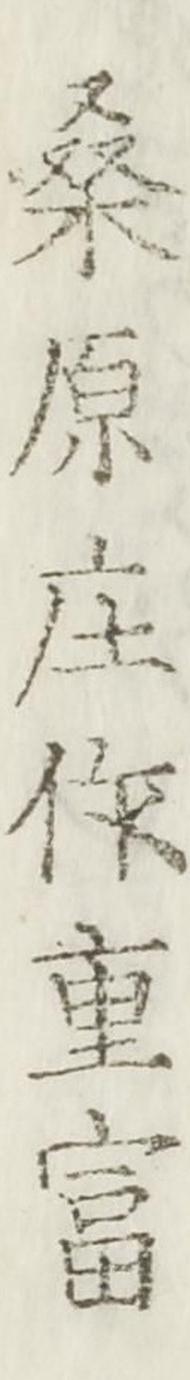に桑原庄作重富
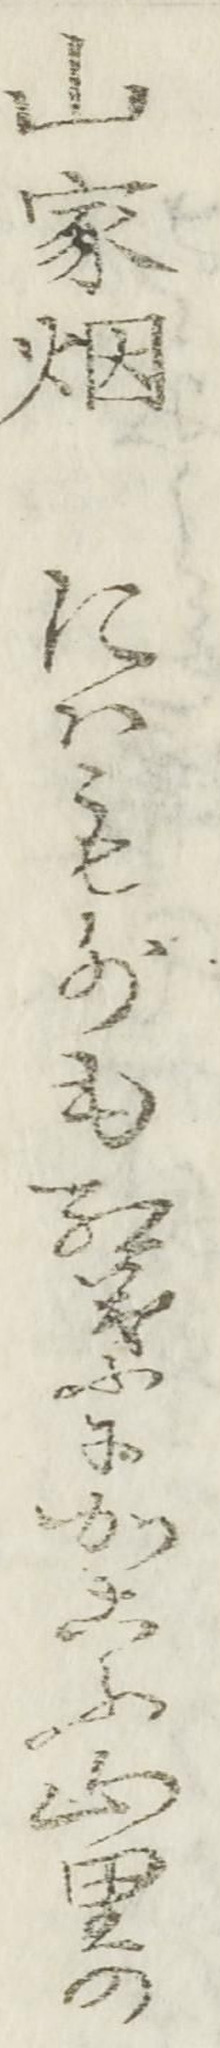山家烟にはも外も紅葉にかよふ山里の
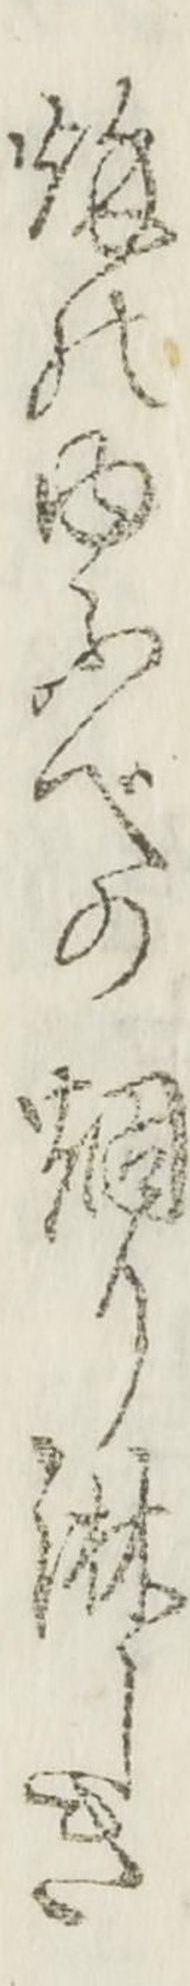秋のゆふべの烟り淋しき
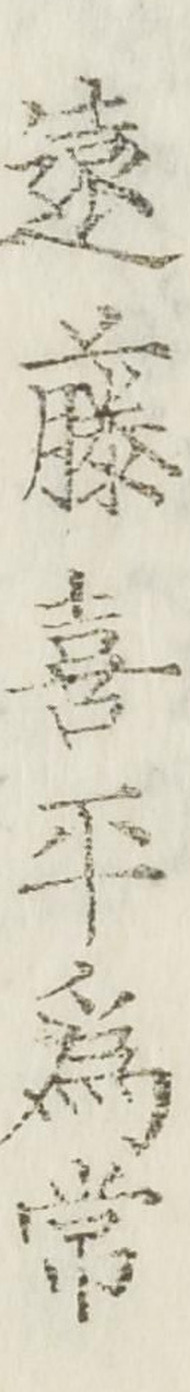よ遠藤喜平為常
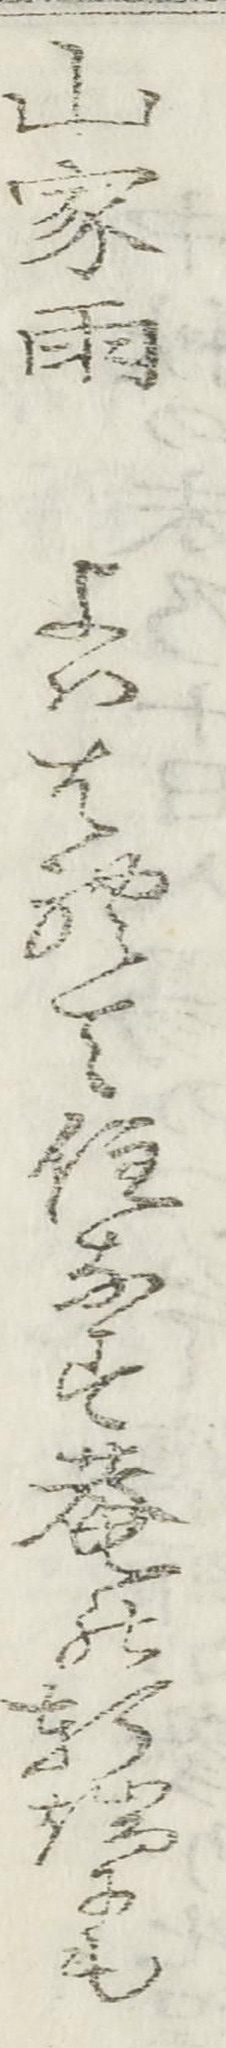山家雨よいはれて住なす菴の軒端にも
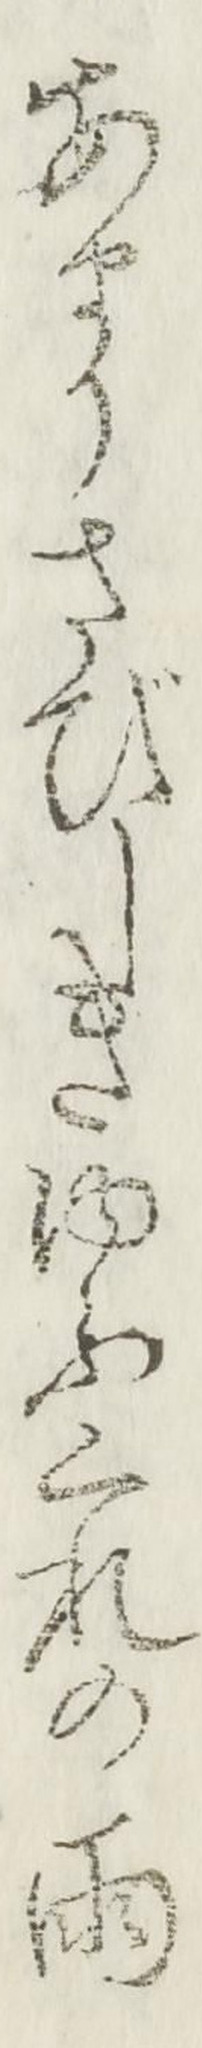あまりさびしきゆふくれの雨
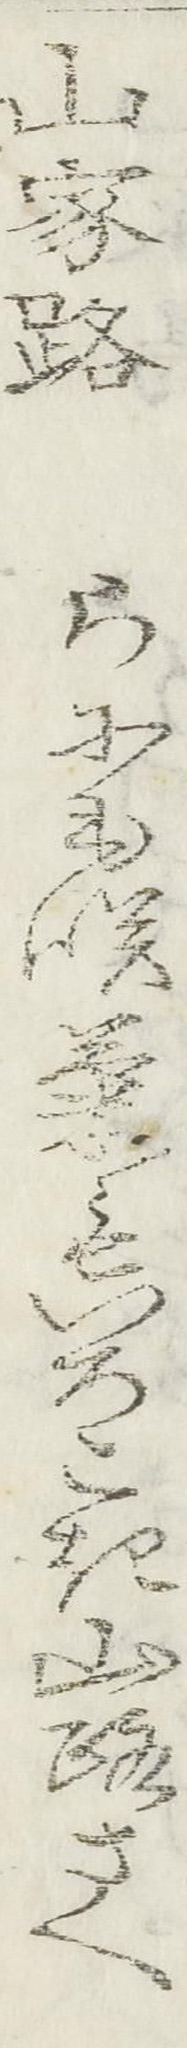山家路らにも咲菊もいろこき山路さへ
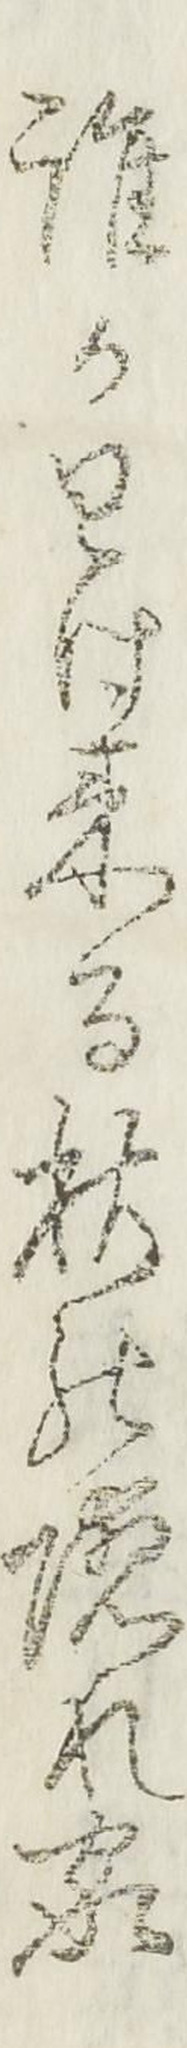誰かわけ来る秋の隠れ家
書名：鎌先温泉由來記
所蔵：東京大学地震研究所図書室 Earthquake Research Institute Library, The University of Tokyo, JAPAN
